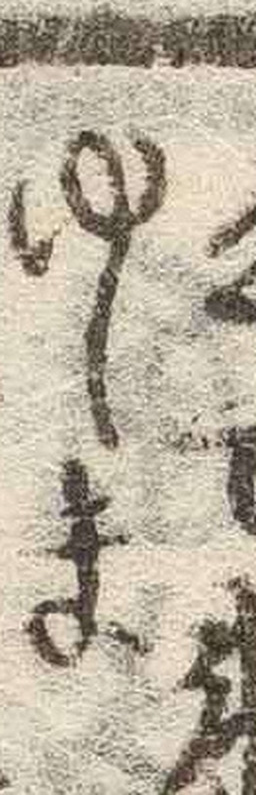ゆしま
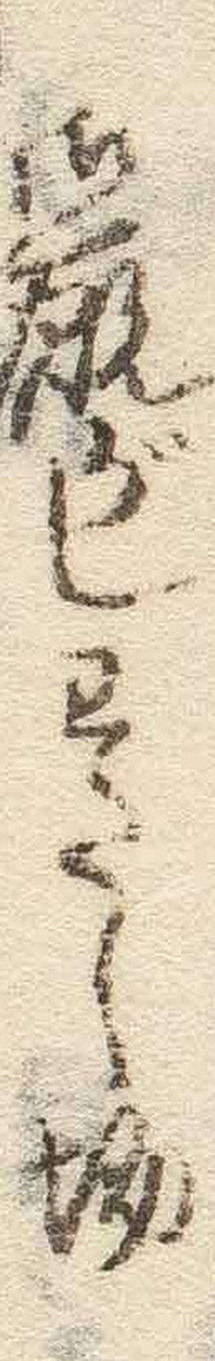御厩がしわたし場
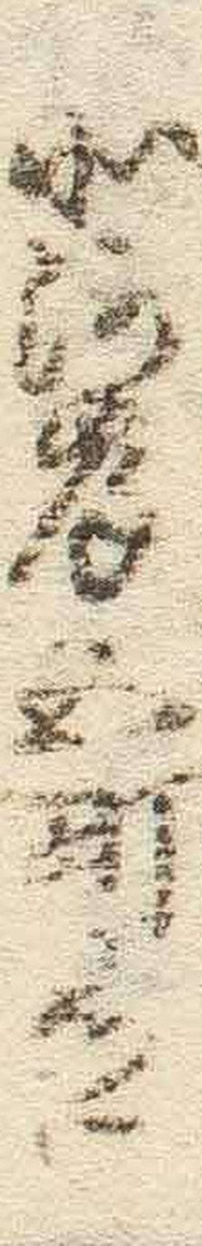北河岸五町有
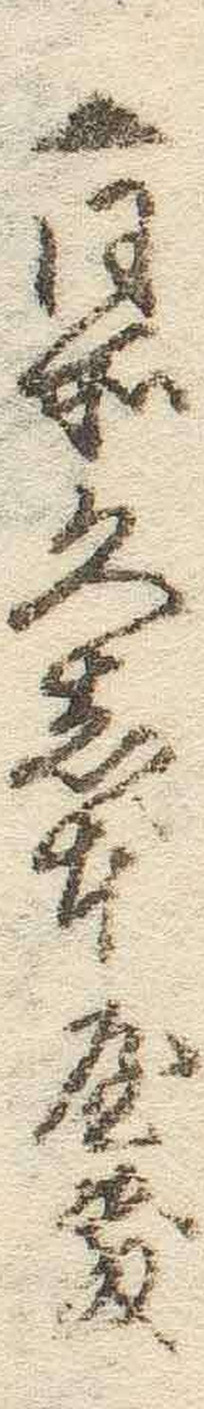▲同所久志本屋敷
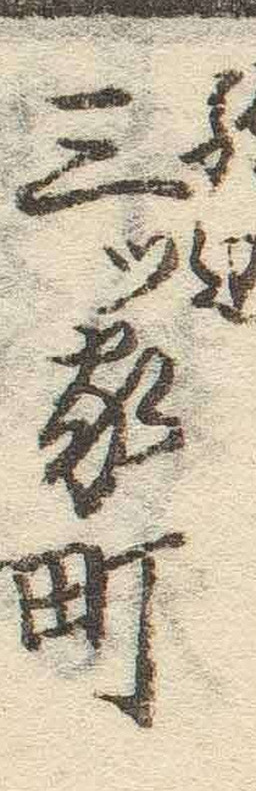三ッ家町
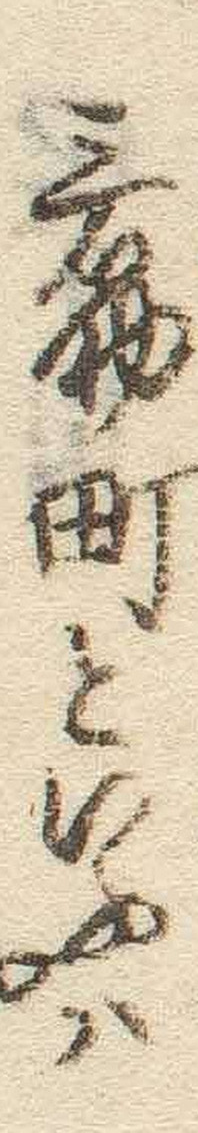三筋町といふは
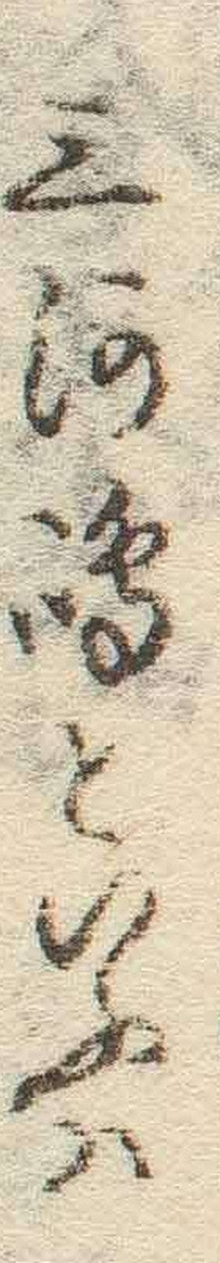三河島といふは
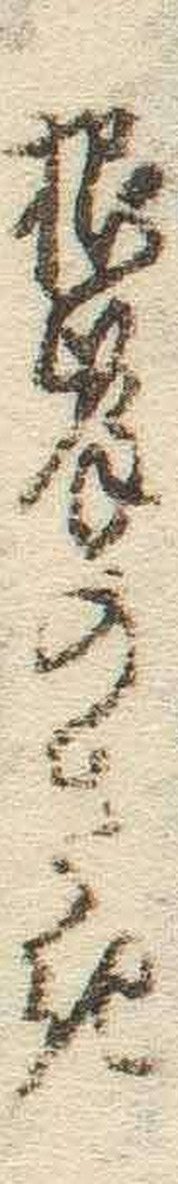根岸のさき
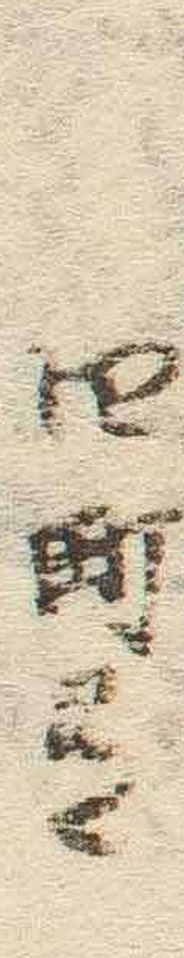四町有
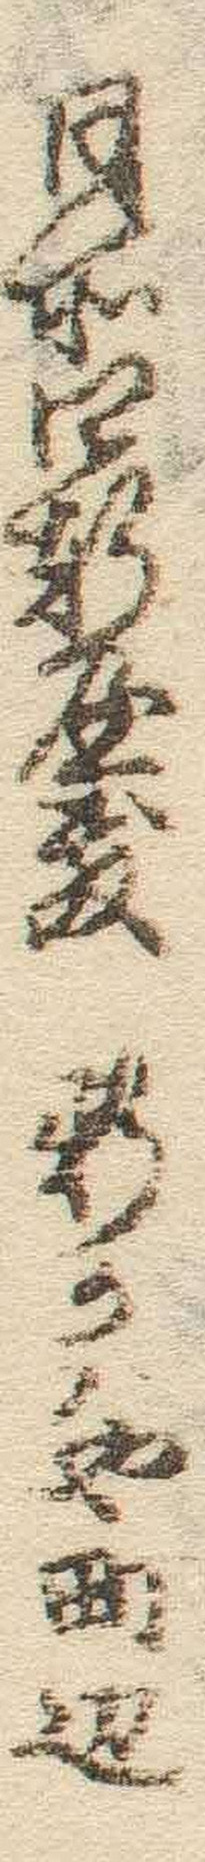同所四軒屋敷新かはや町辺
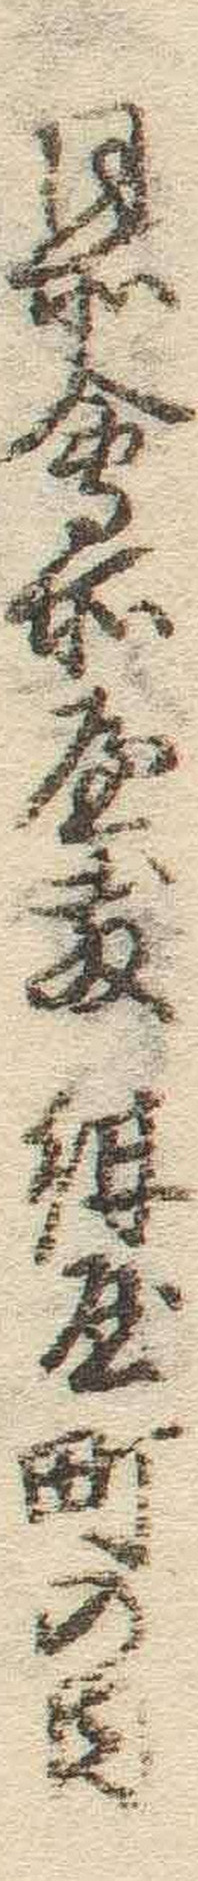同所会所屋敷紺屋町の内
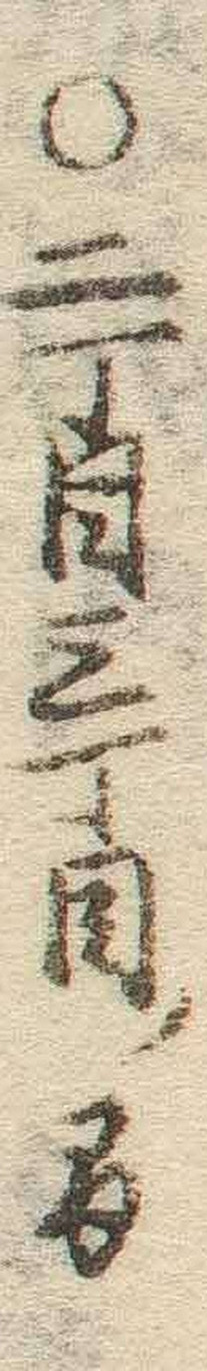○二丁目三丁目ノ間

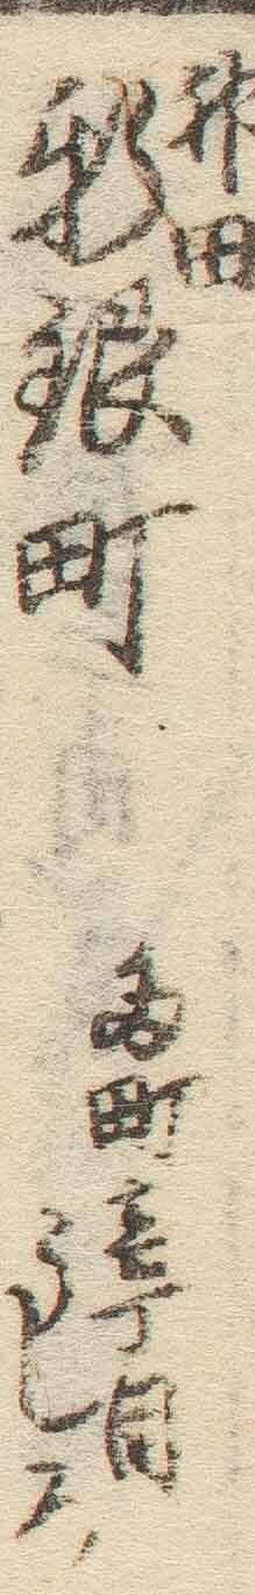新銀町多町壱丁目
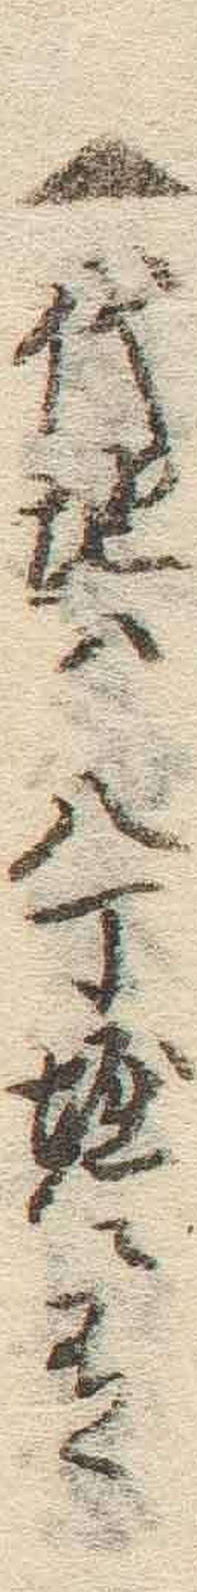▲代地は八丁掘に有
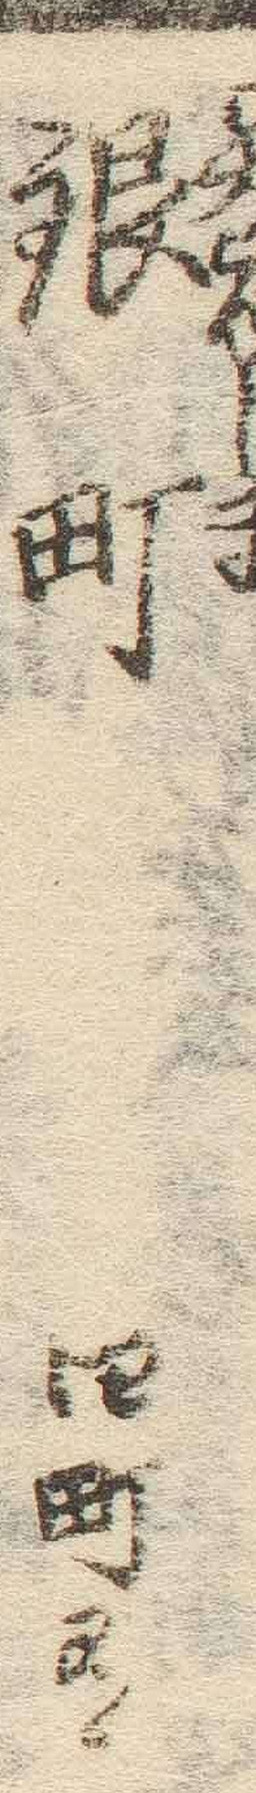銀町四町有
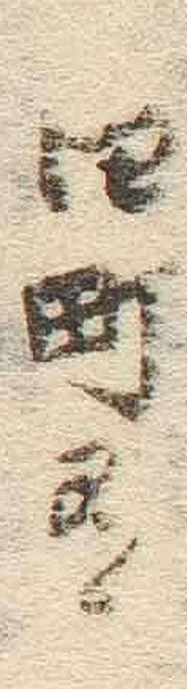二町有
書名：江戸町独案内
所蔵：東京学芸大学附属図書館 国文学研究資料館
